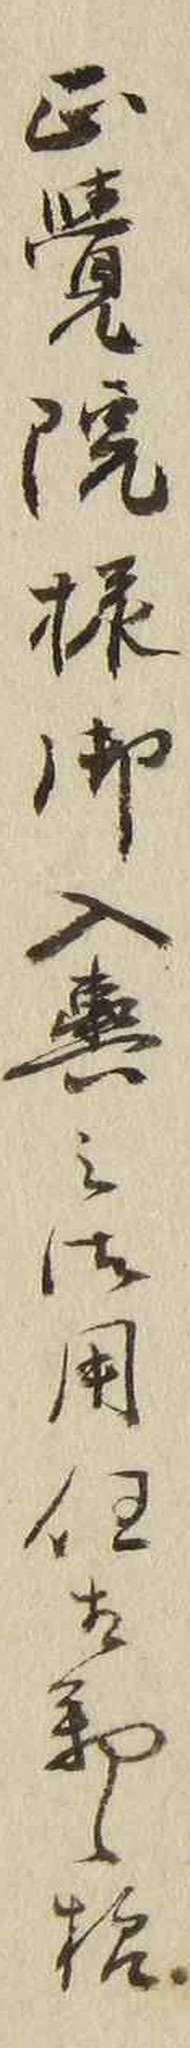正覚院様御入輿之御用任相勤候様
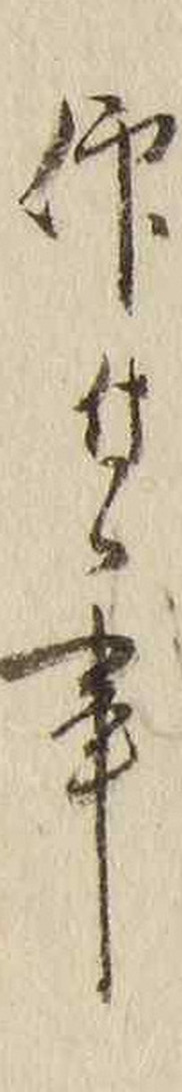仰付候事

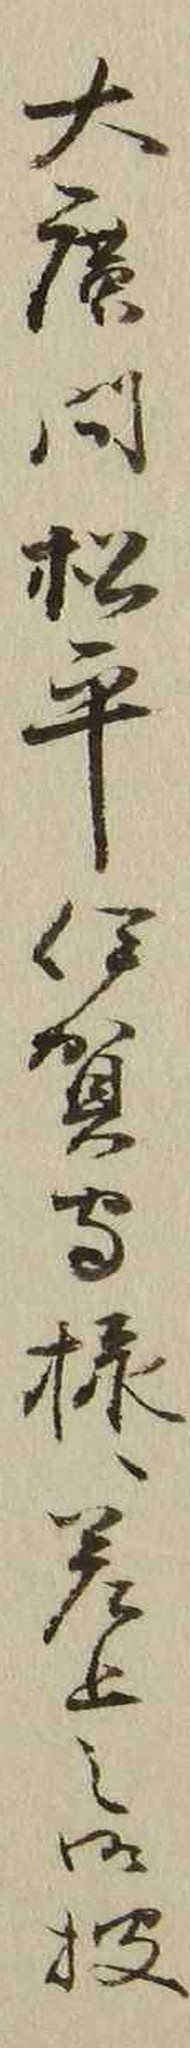大広間松平伊賀守様へ差上之御披
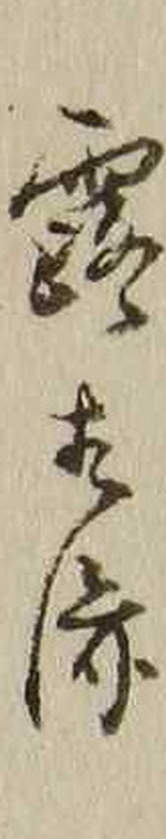露相済
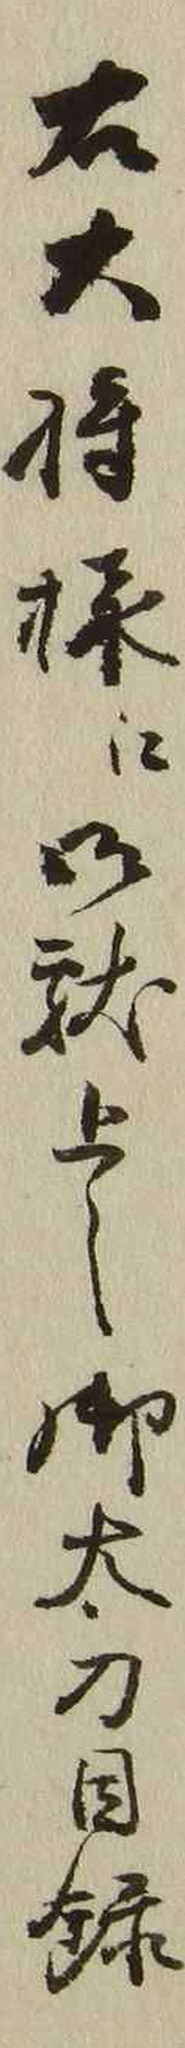右大将様江御献上之御太刀目録
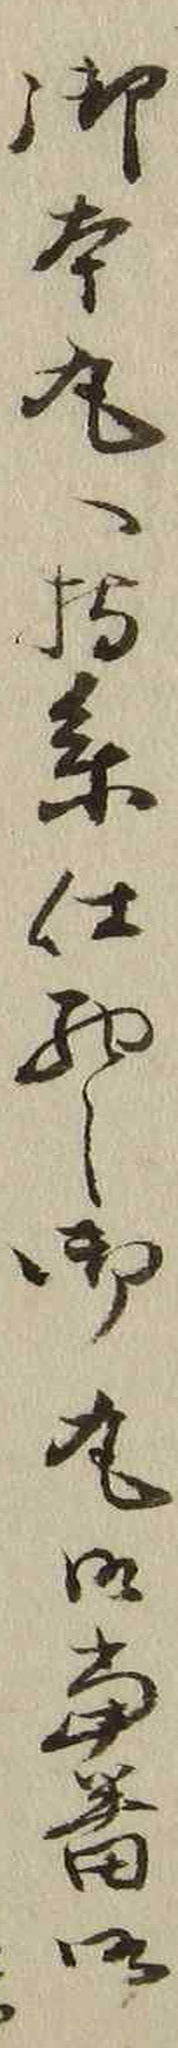御本丸へ持参仕西之御丸御当番御
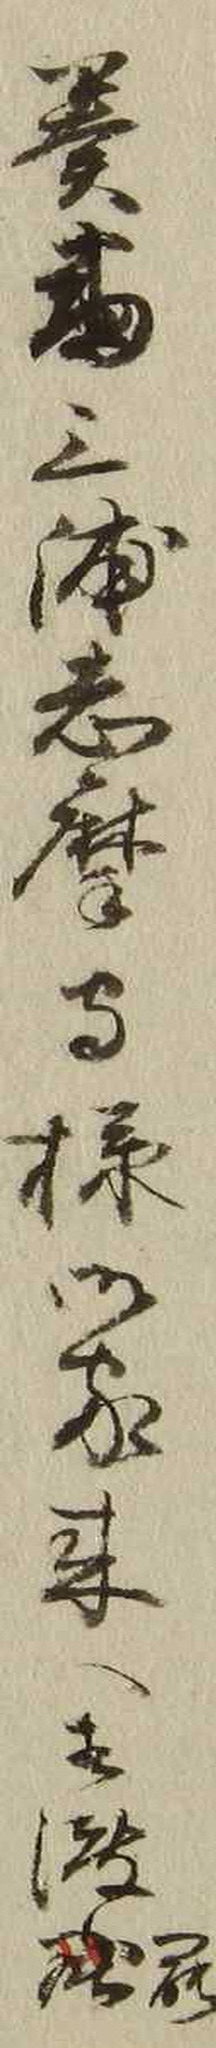奏番三浦志摩守様御家来へ相渡罷罷
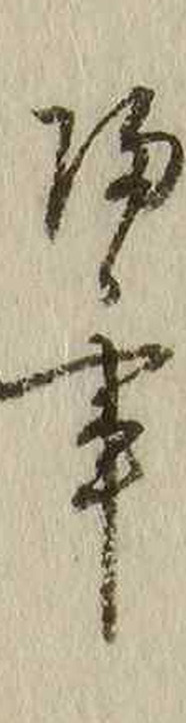帰候事
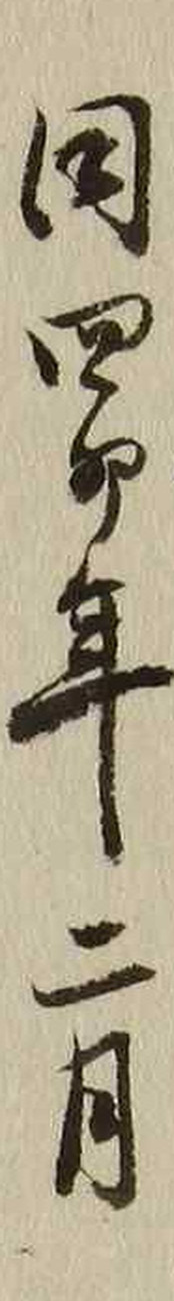一同四卯年二月
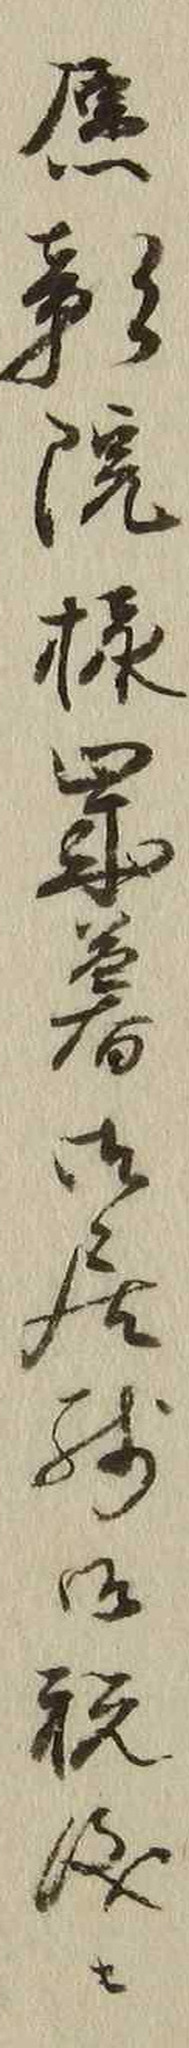愿彰院様歳暮御居残御祝儀被
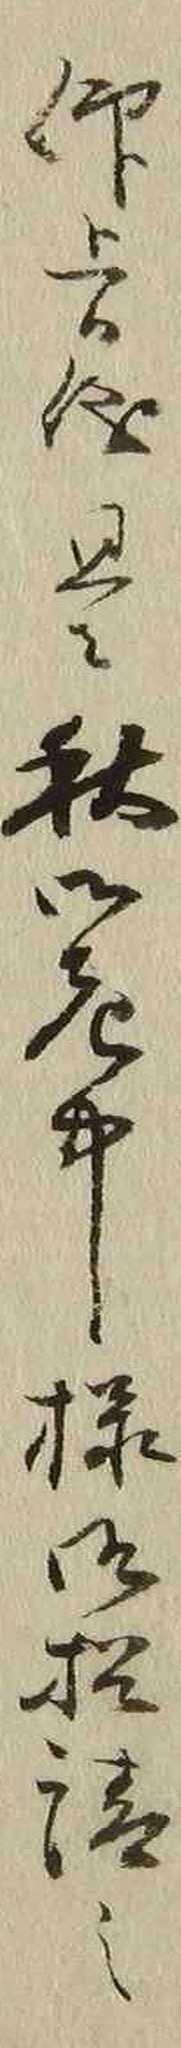仰上候儀且其秋御老中様御招請之
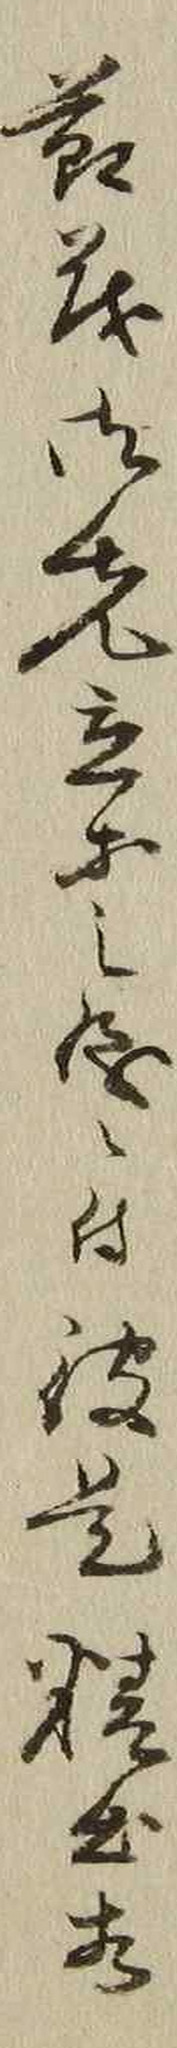節茂御先立等之儀ニ付彼是精出相
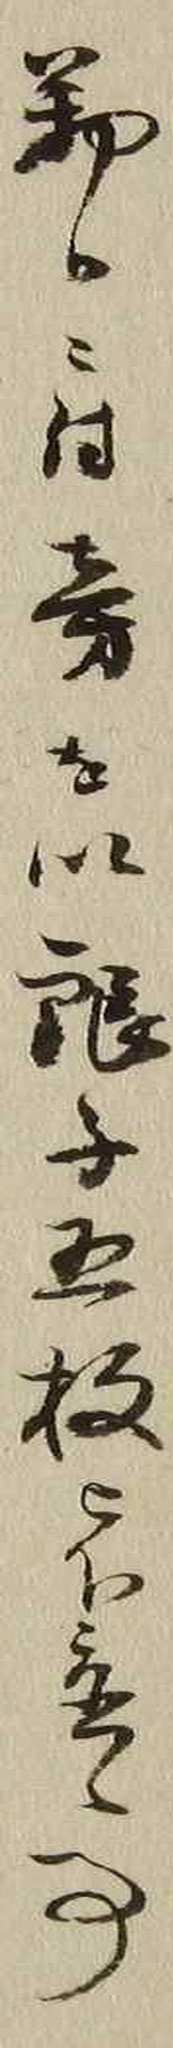勤候ニ付旁を以銀子五枚被下置候事
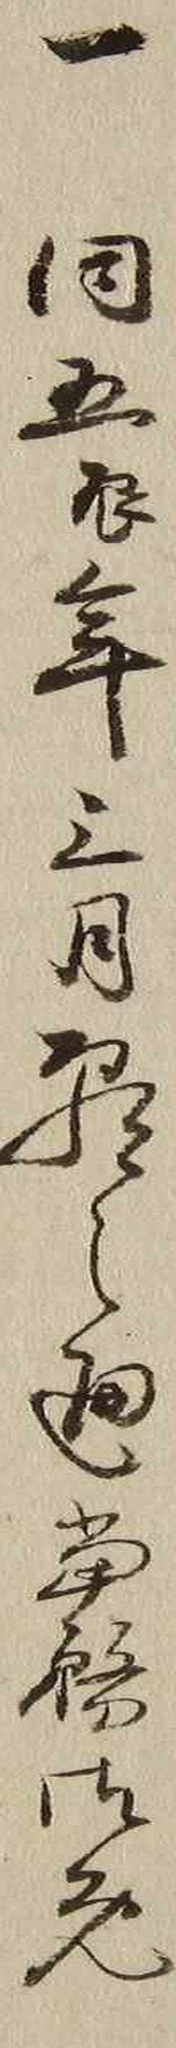一同五辰年三月願之通当務御免
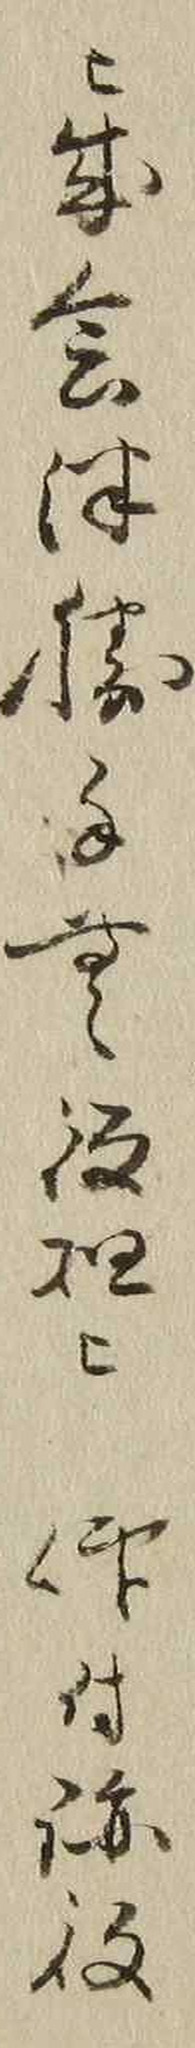被成会津勝手無役組被仰付跡役
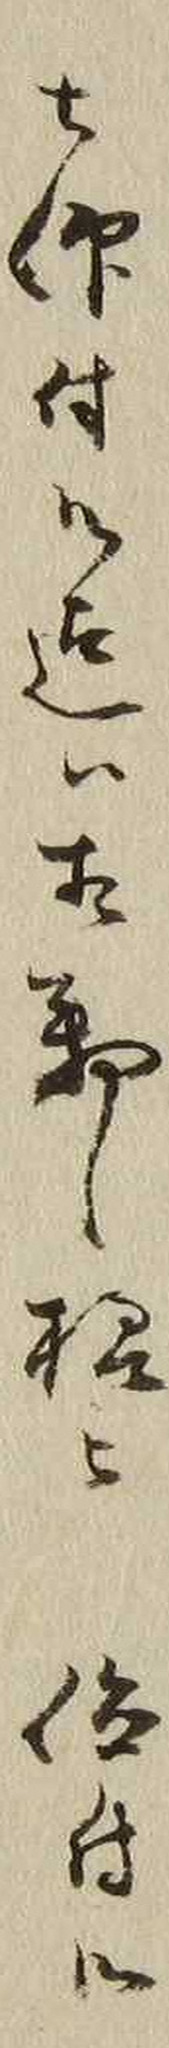被仰付候迄ハ相勤候様被仰付候
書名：諸士系譜　巻之225　ま之部6
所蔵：会津若松市立会津図書館
